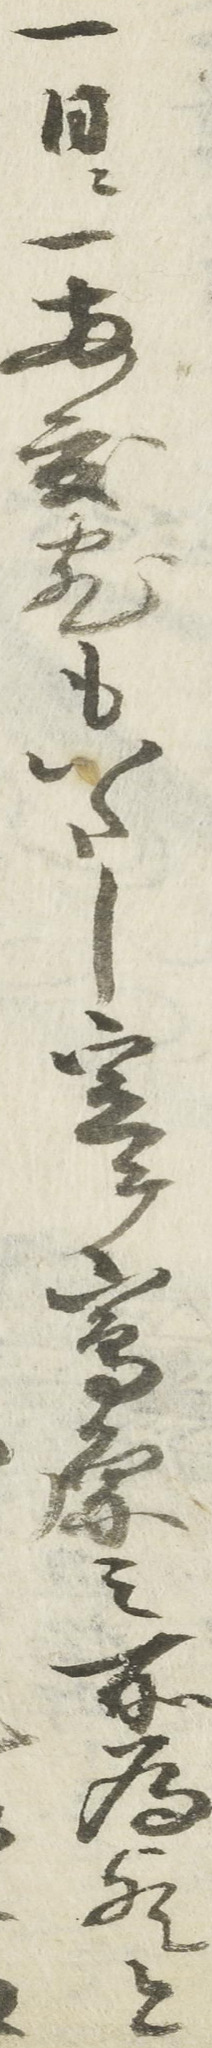一日ニ一両度宛もいたし定テ嶋原の所為歟と
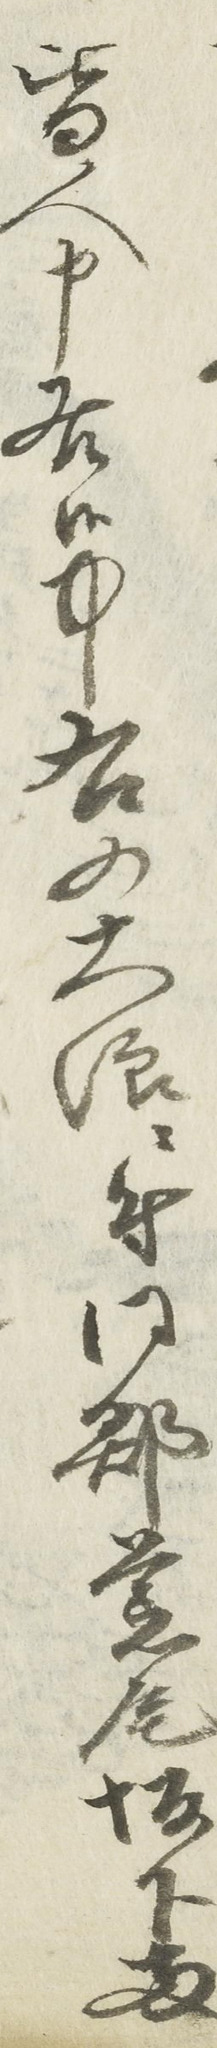皆人申居候中右の大浪ニ付同郡荒尾坂下両
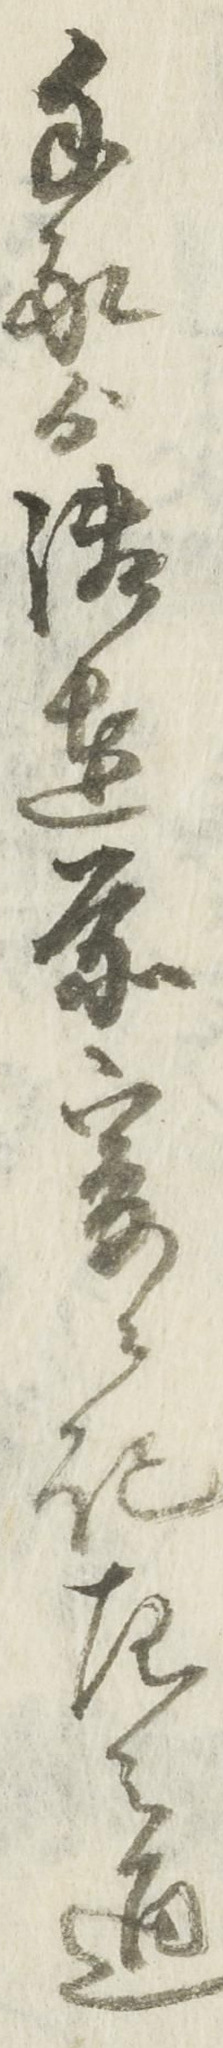手永ゟ御達前爰ニ記左之通
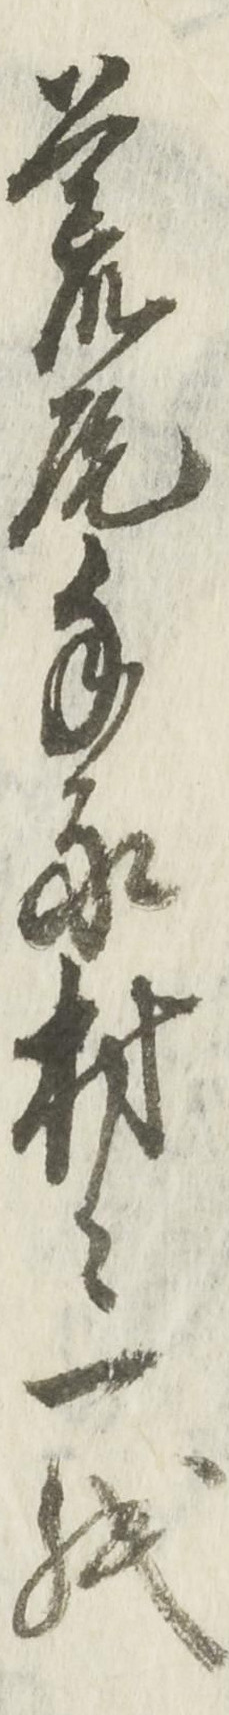荒尾手永村々一紙
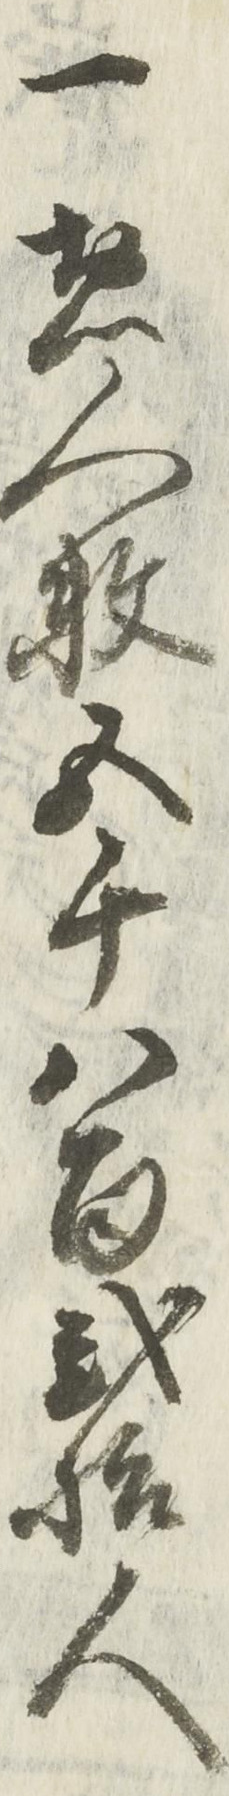一惣人数五千八百弐拾人
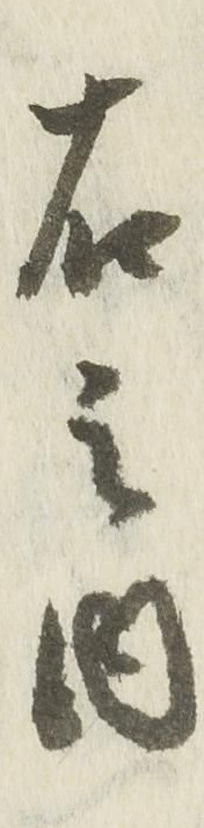右之内

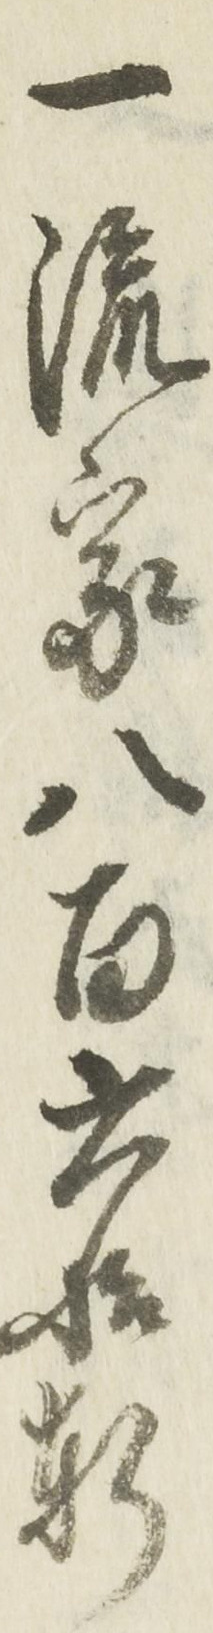一流家八百六拾軒
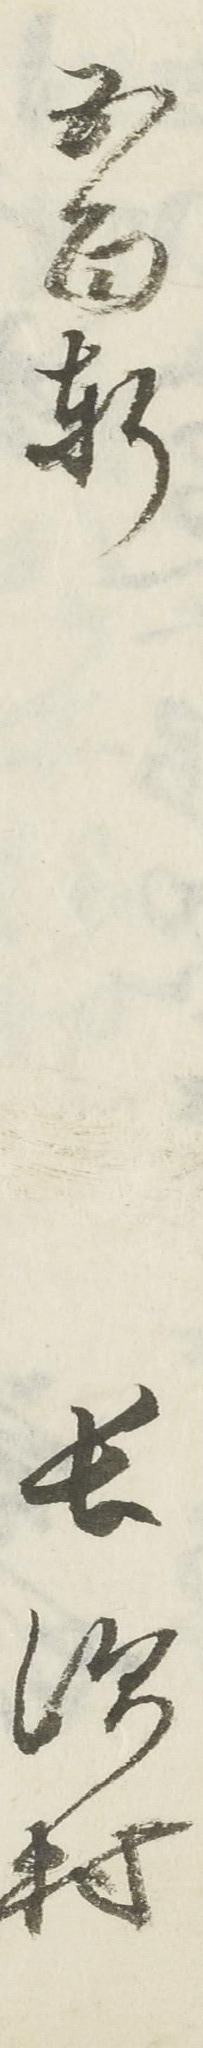五百軒長次村
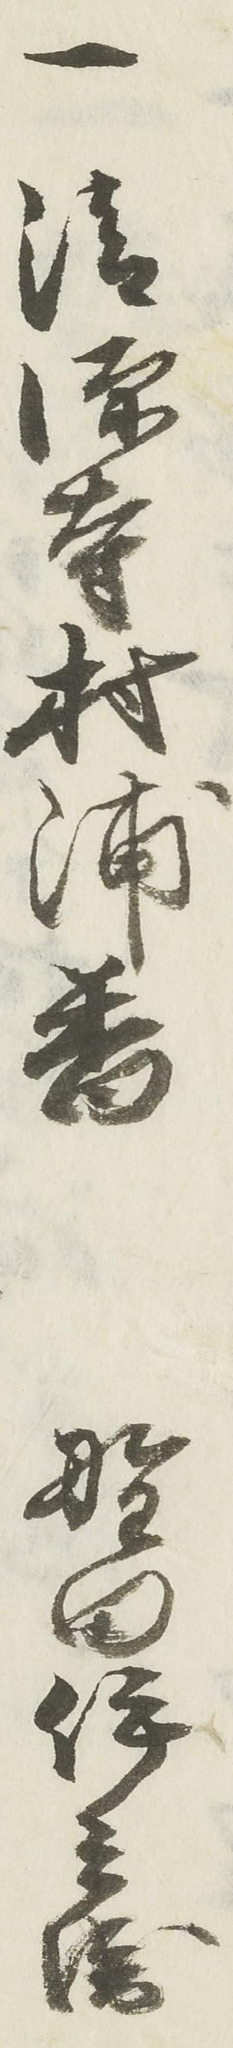一清源寺村浦番野田伊兵衛
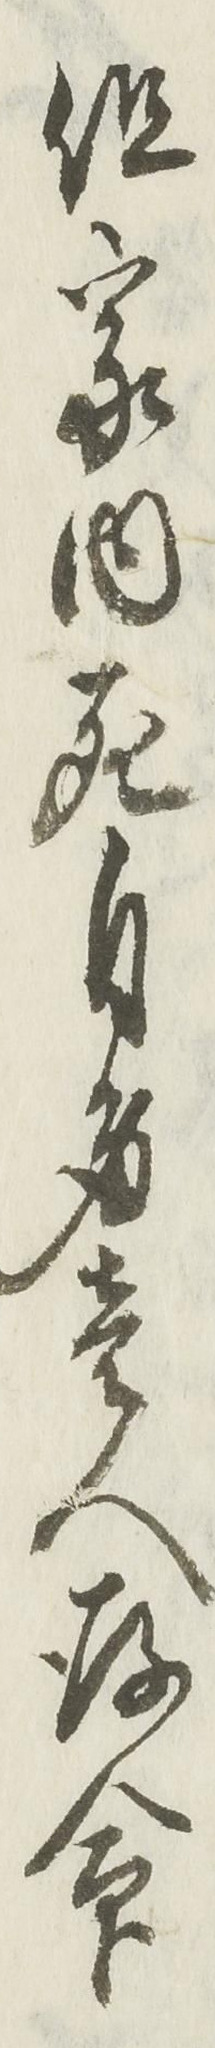但家内死自身壱人存命
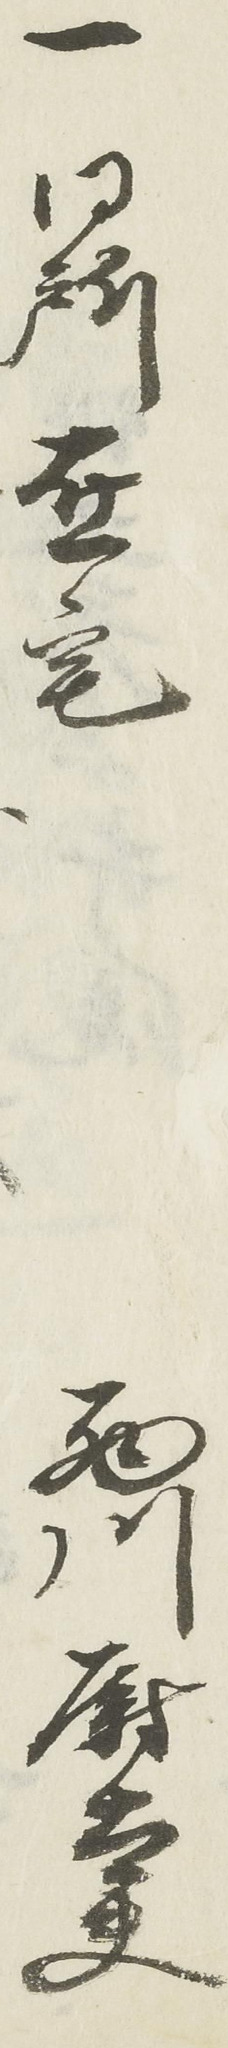一同所在宅西川厨太夫
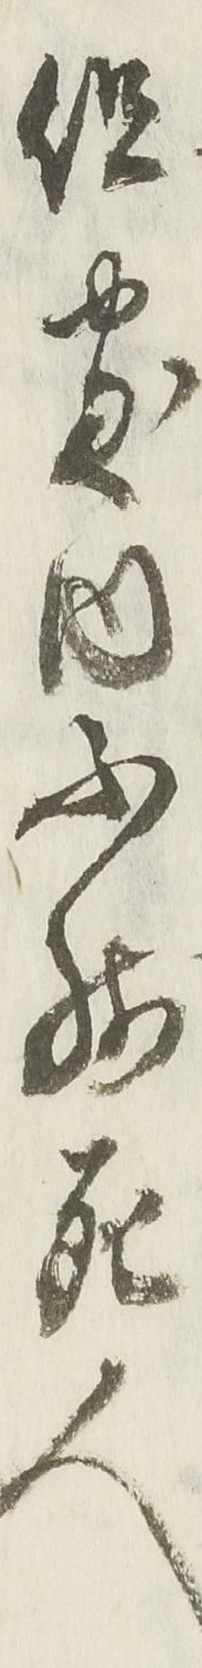但家内不残死人
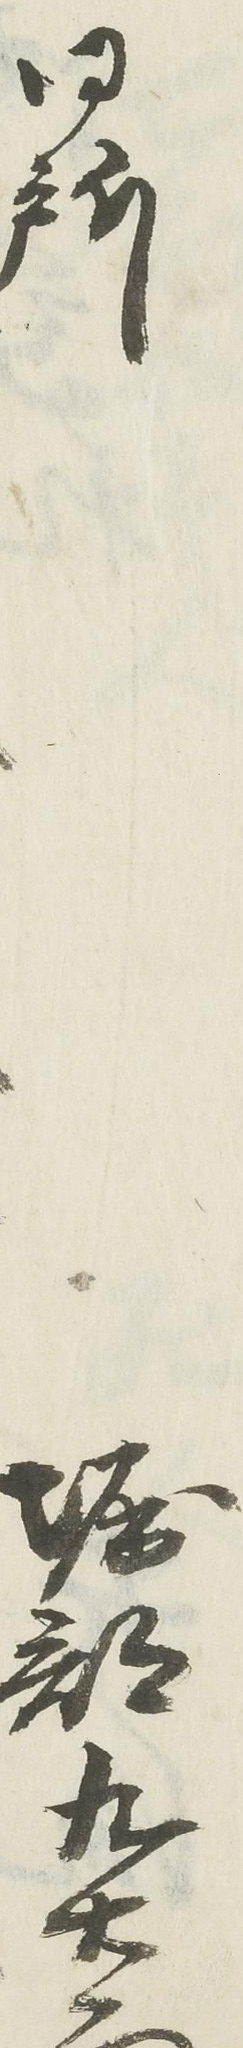一同所堀部九右衛門
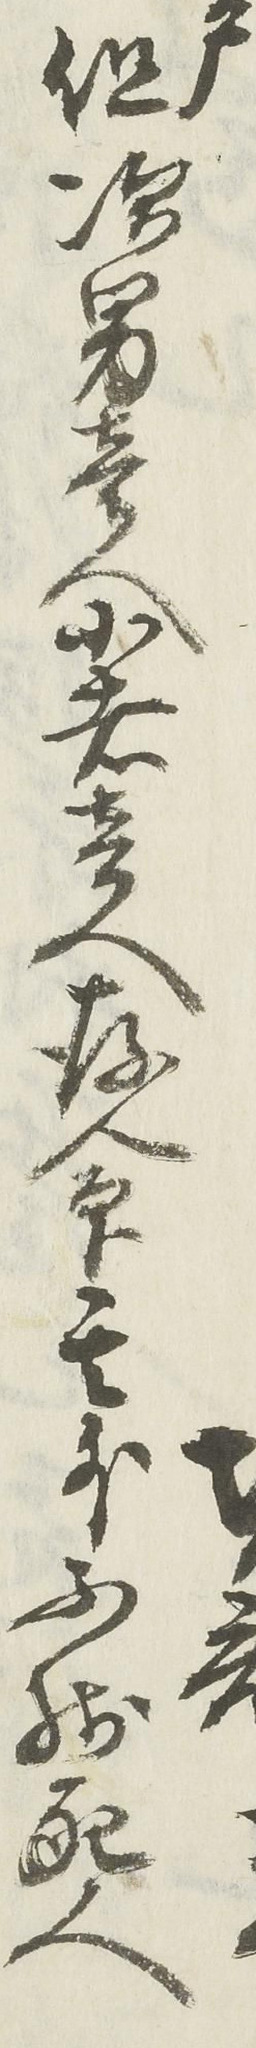但次男壱人小者壱人存命其外不残死人
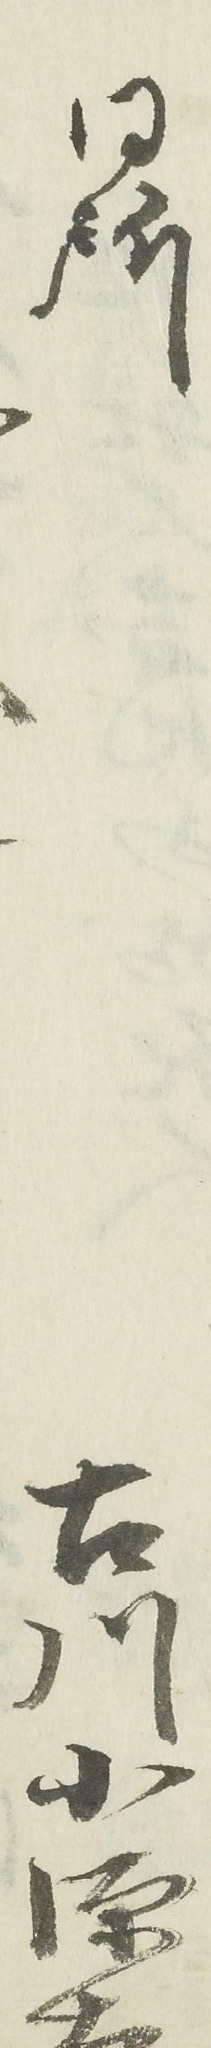一同所古川小源太
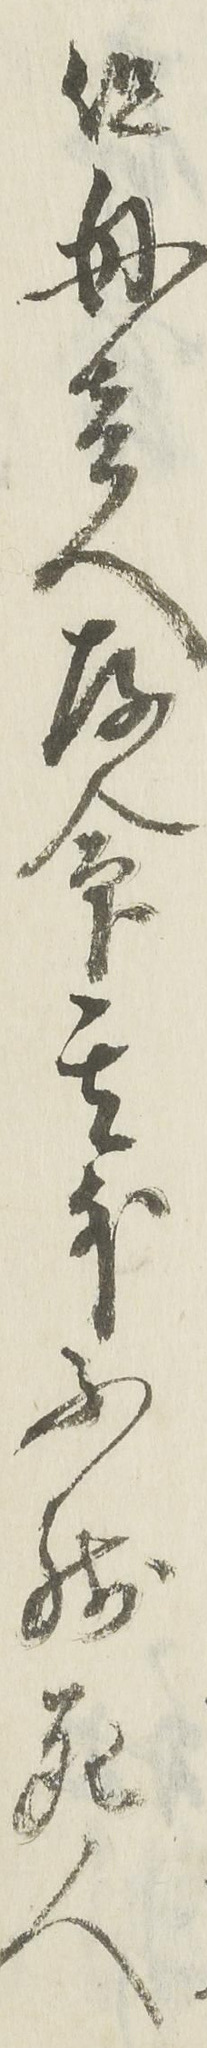但母壱人存命其外不残死人
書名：後見笑
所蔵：東京大学地震研究所図書室 Earthquake Research Institute Library, The University of Tokyo, JAPAN
